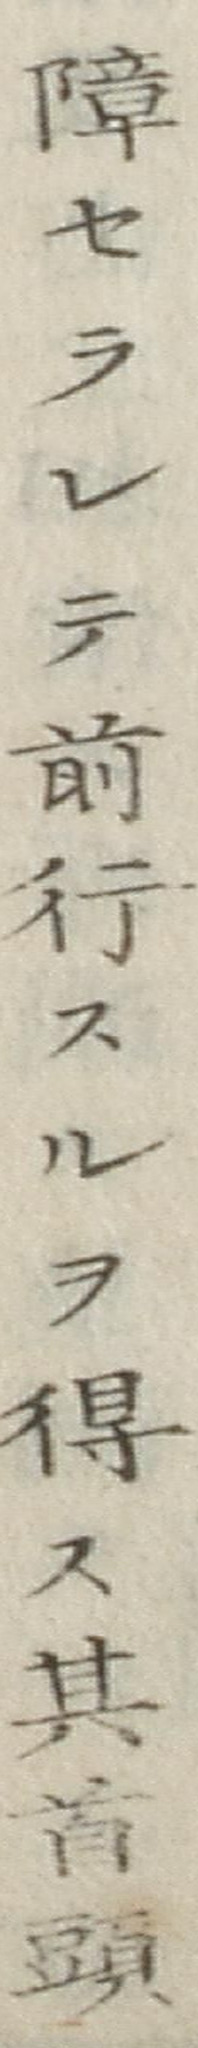障セラレテ前行スルヲ得ス其首頭
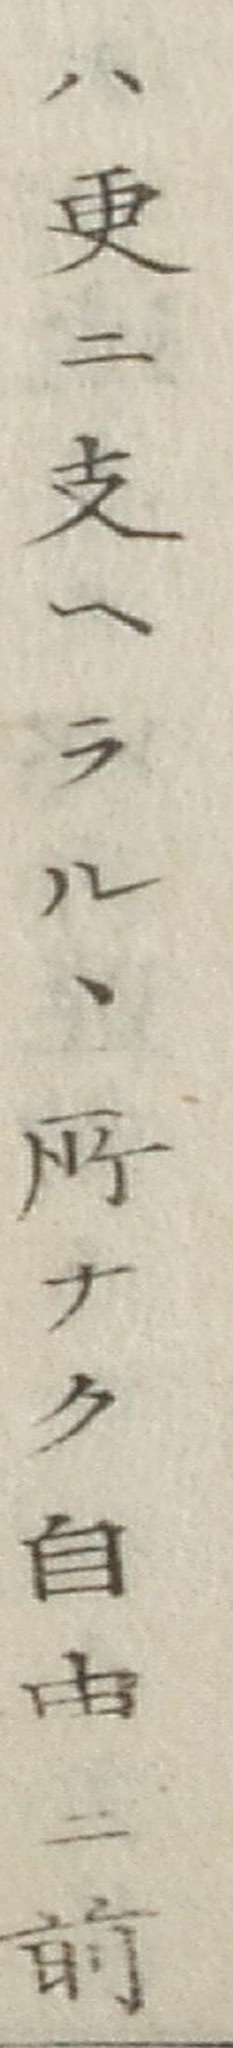ハ更ニ支ヘラルヽ所ナク自由ニ前
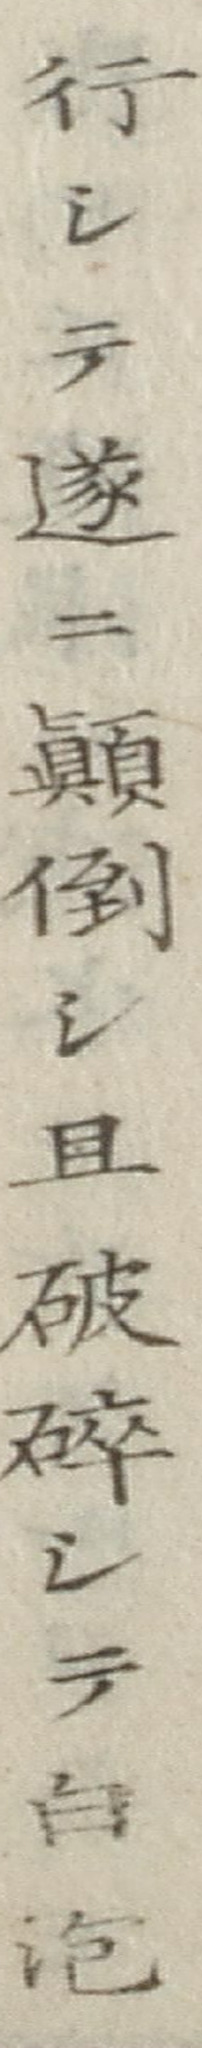行シテ遂ニ顚倒シ且破砕シテ白泡
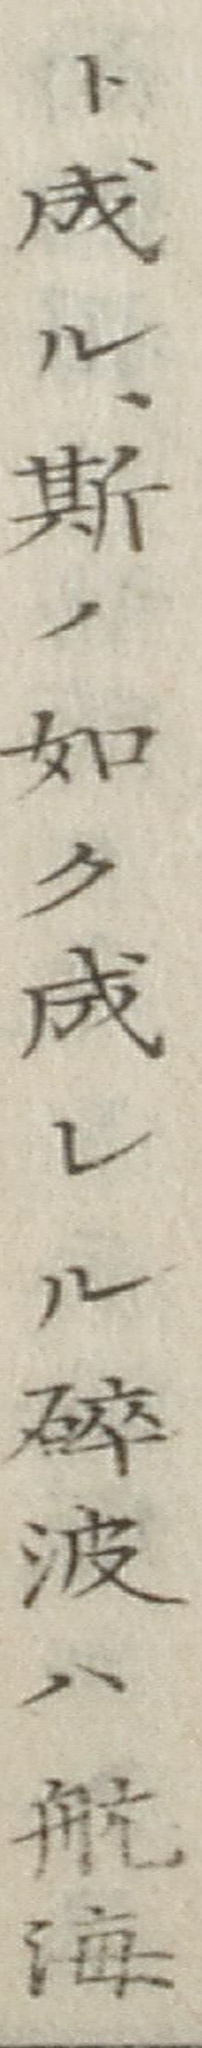ト成ル、斯ノ如ク成レル砕波ハ航海
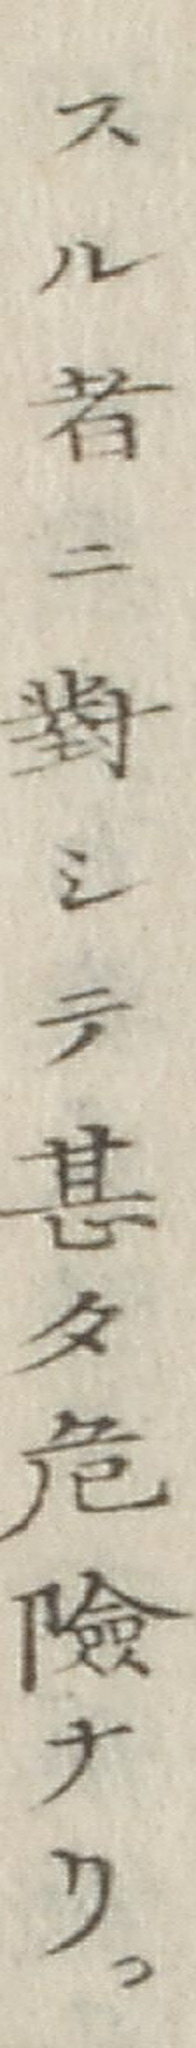スル者ニ対シテ甚タ危険ナリ。
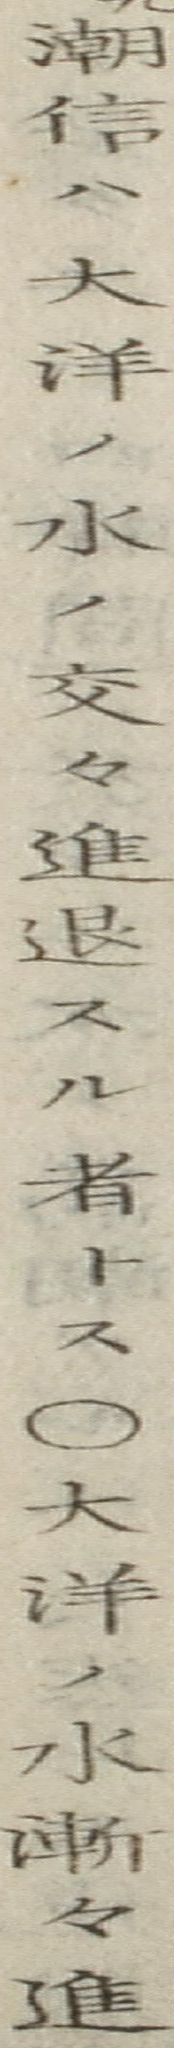十九潮信ハ大洋ノ水ノ交々進退スル者トス○大洋ノ水漸々進
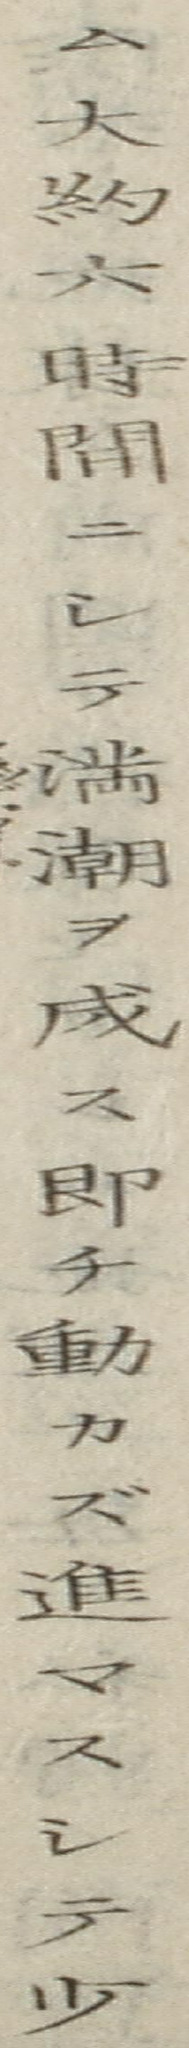ム大約六時間ニシテ満潮ヲ成ス即チ動カズ進マスシテ少
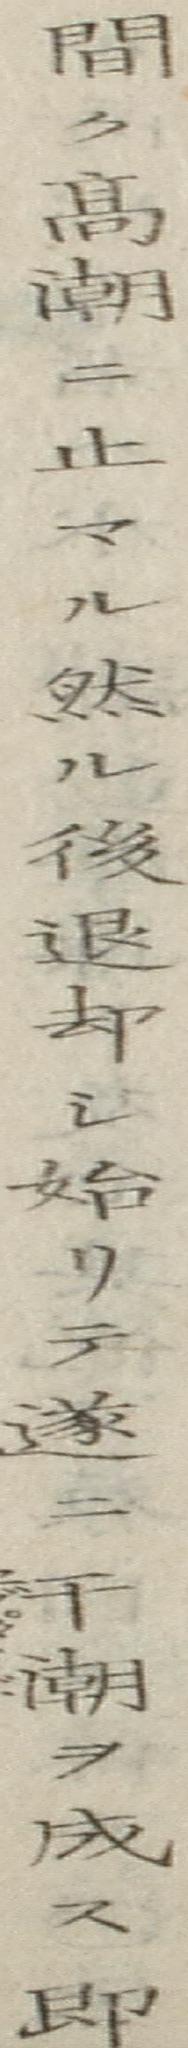間ク高潮ニ止マル然ル後退却シ始リテ遂ニ干潮ヲ成ス即
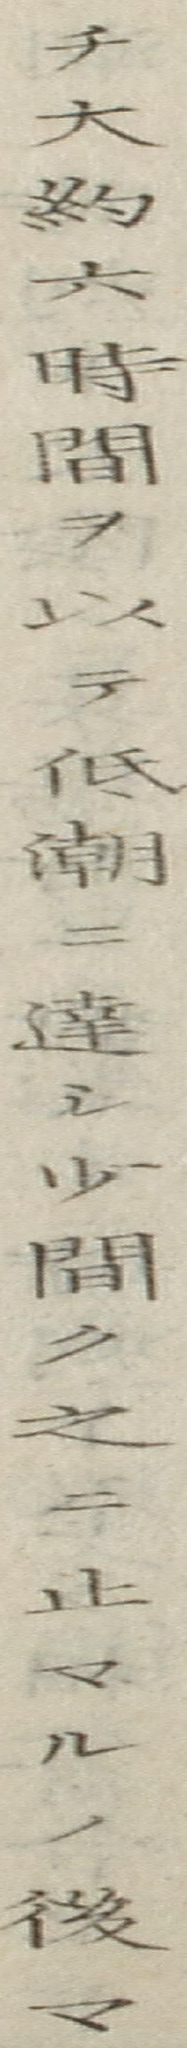チ大約六時間ヲ以テ低潮ニ達シ少間ク之ニ止マルノ後マ
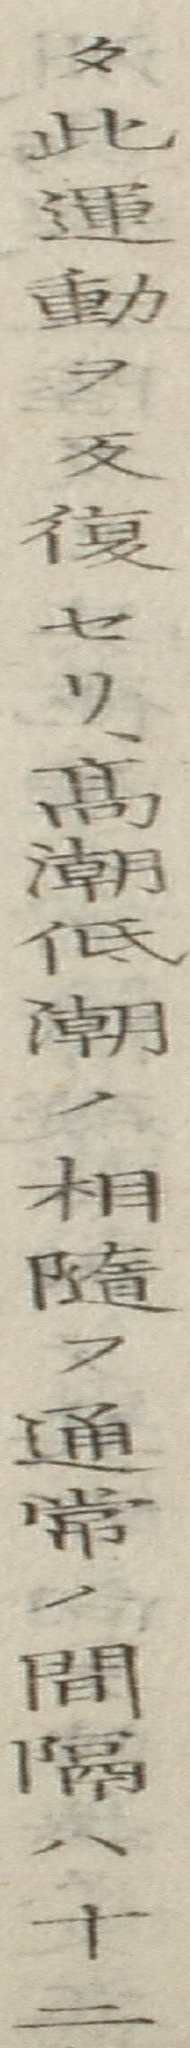タ此運動ヲ反復セリ、高潮低潮ノ相随フ通常ノ間隔ハ十二
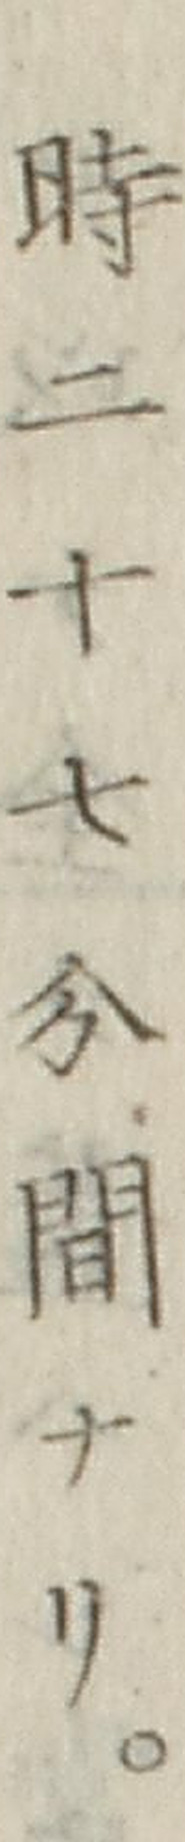時二十七分間ナリ。
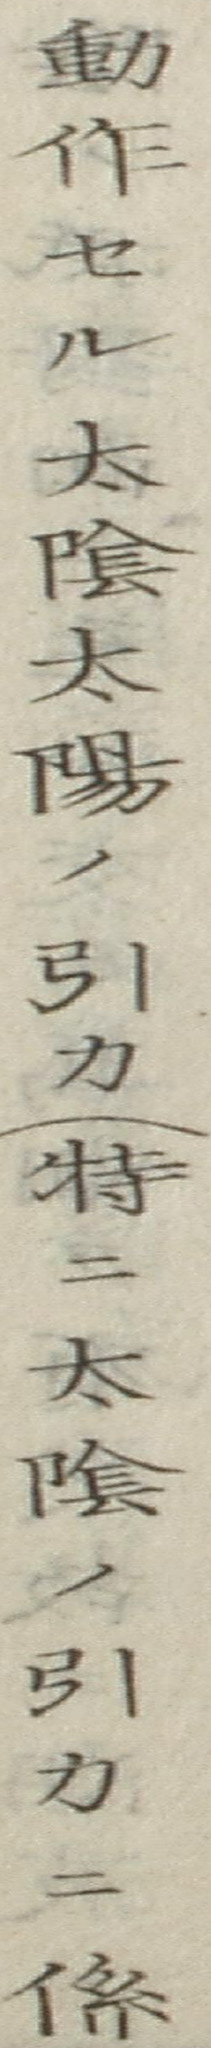動作セル太陰太陽ノ引力（特ニ太陰ノ引力ニ係
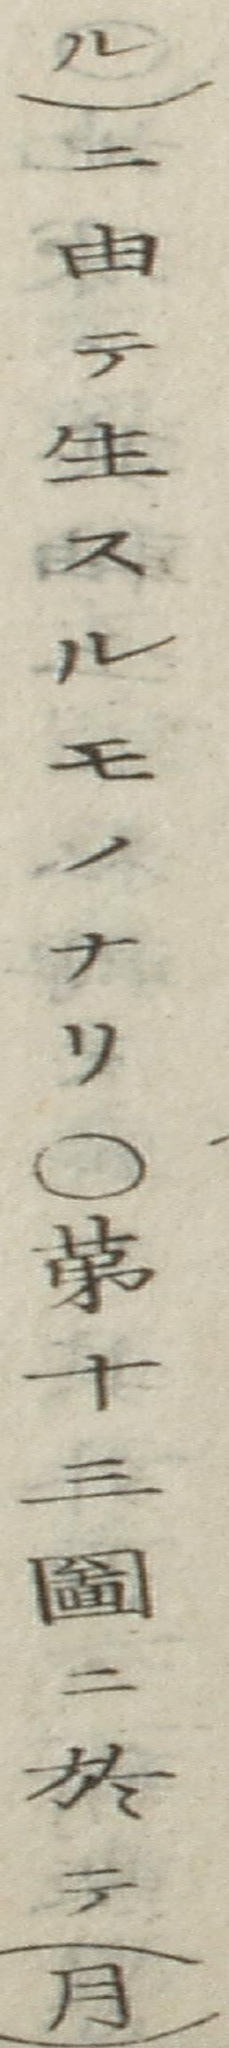ル）ニ由テ生スルモノナリ○第十三図ニ於テ
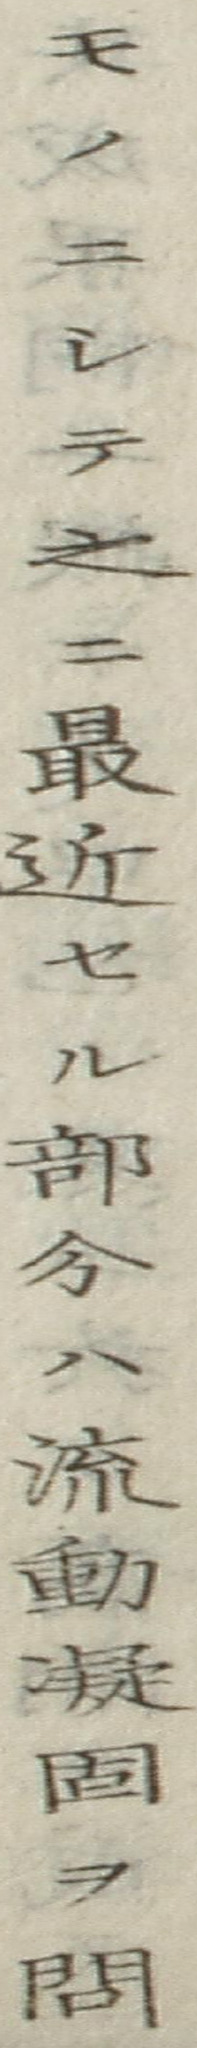モノニシテ之ニ最近セル部分ハ流動凝固ヲ問
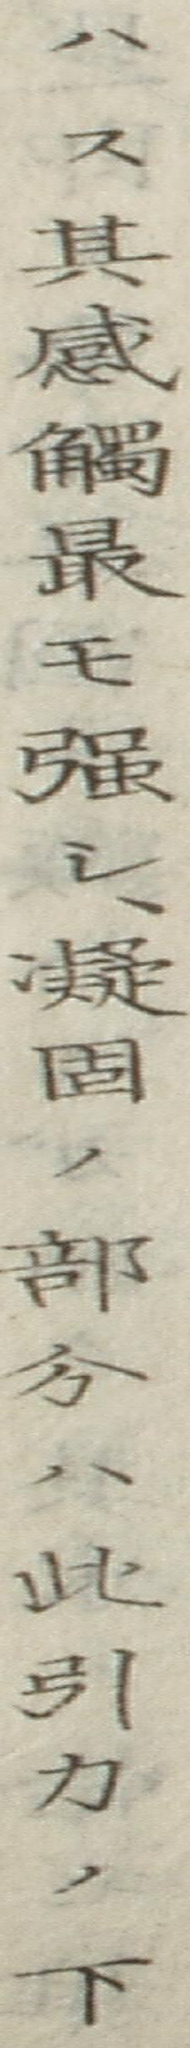ハス其感触最モ強シ、凝固ノ部分ハ此引力ノ下
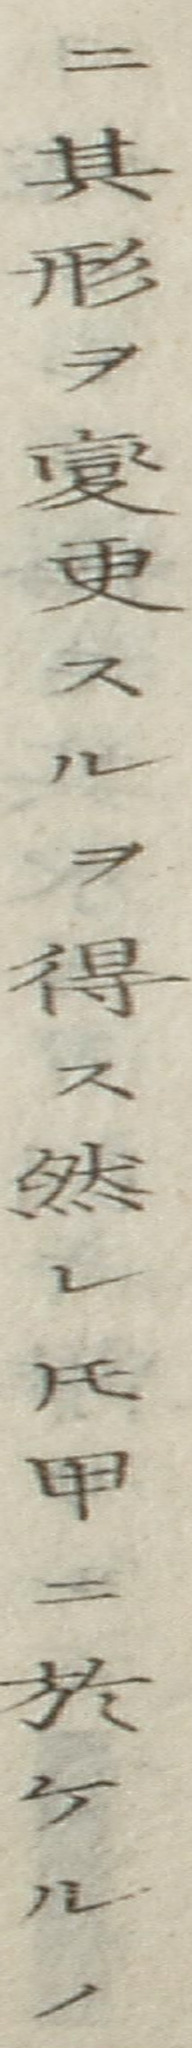ニ其形ノ変更スルヲ得ズ然レトモ甲ニ於ケルノ
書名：地形論　巻二
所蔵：東京大学地震研究所図書室 Earthquake Research Institute Library, The University of Tokyo, JAPAN
